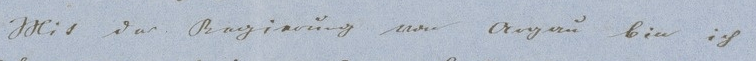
Mit der Regierung von Argau bin ich
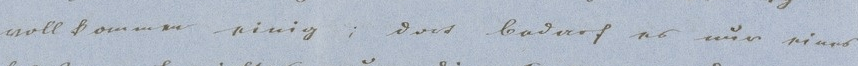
vollkommen einig; dort bedarf es nur eines
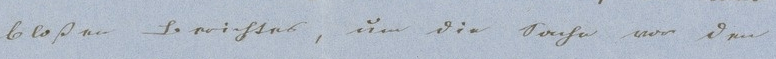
bloßen Berichtes, um die Sache vor den
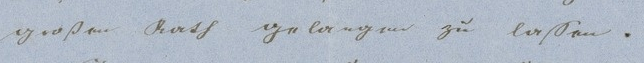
großen Rath gelangen zu lassen.
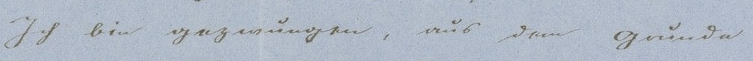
Ich bin gezwungen, aus dem Grunde
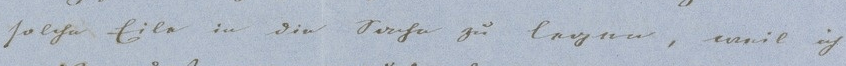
solche Eile in die Sache zu legen, weil ich
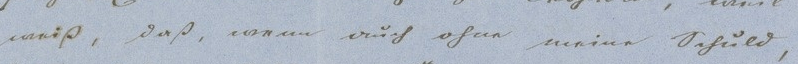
weiß, daß, wenn auch ohne meine Schuld,
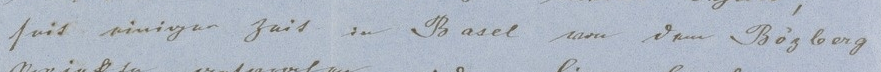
seit einiger Zeit in Basel von dem Bözberg
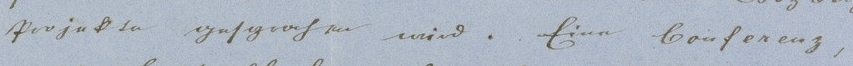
Projekte gesprochen wird. Eine Conferenz,
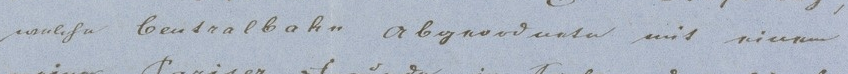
welche Centralbahn Abgeordnete mit einem
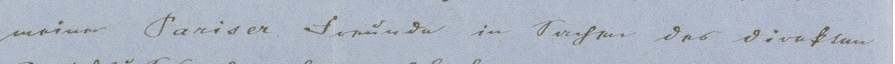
meiner Pariser Freunde in Sachen des direkten
